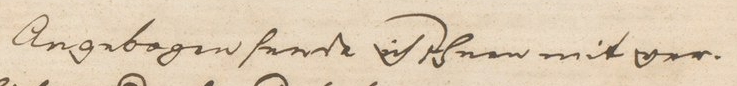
Angebogen sende ich Ihnen mit ver-
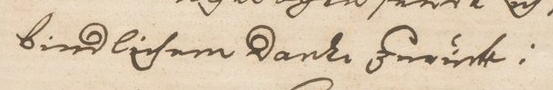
bindlichem Dank zurück:
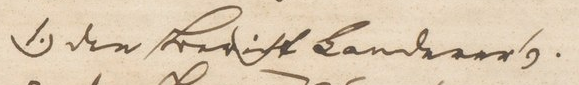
1.) den Bericht Landerer's.
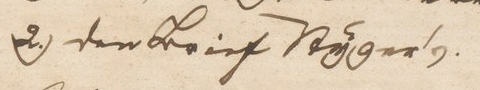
2.) den Brief Styger's.
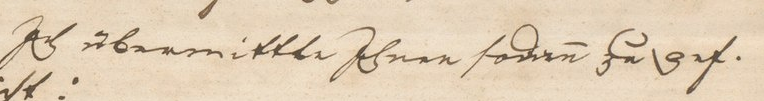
Ich übermittle Ihnen sodann zu gef.
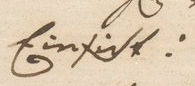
Einsicht:
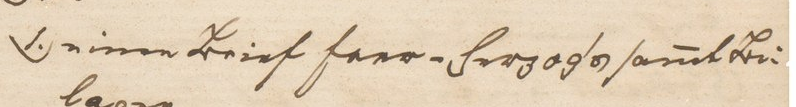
1.) einen Brief Feer-Herzog's sammt Bei-
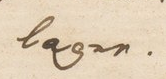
lagen.
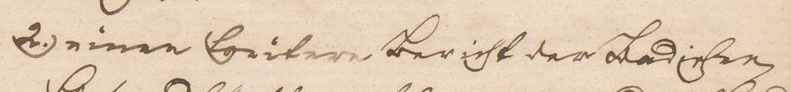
2.) einen weitern Bericht der Badischen
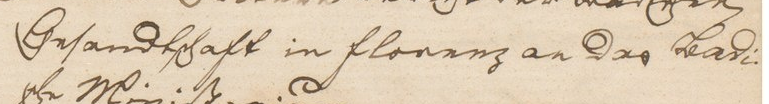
Gesandtschaft in Florenz an das Badi-
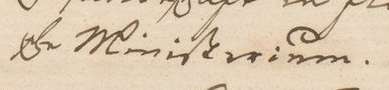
sche Ministerium.
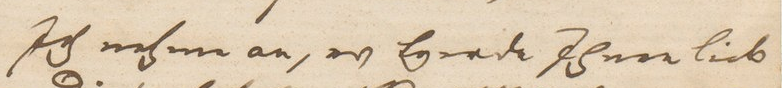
Ich nehme an, es werde Ihnen lieb
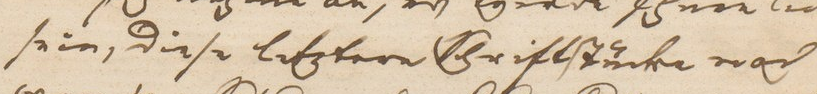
sein, diese letzten Schriftstücke noch
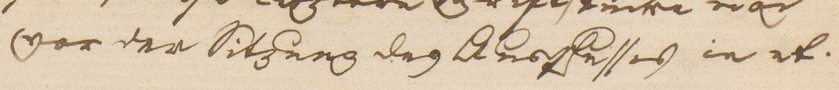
vor der Sitzung des Ausschusses in et-
